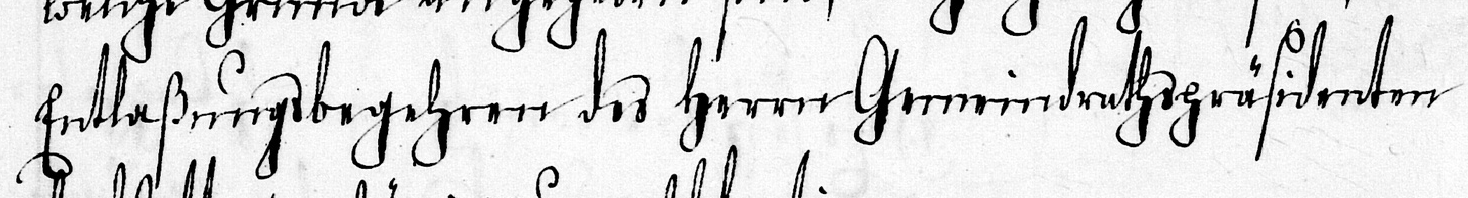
Entlaßungsbegehren des Herrn Gemeindrathspräsidenten
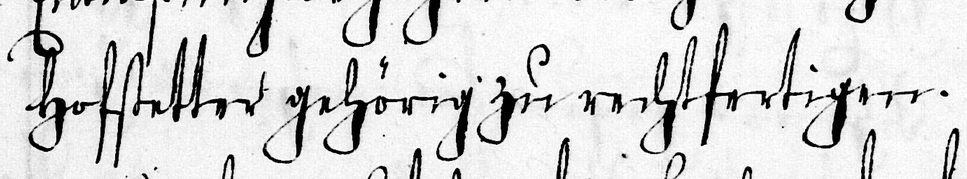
Hofstetter gehörig zu rechtfertigen.
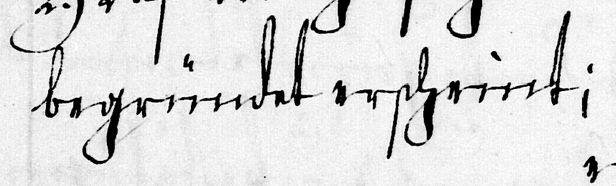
begründet erscheint;
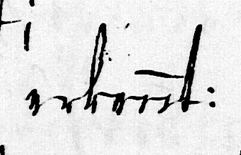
erkennt:
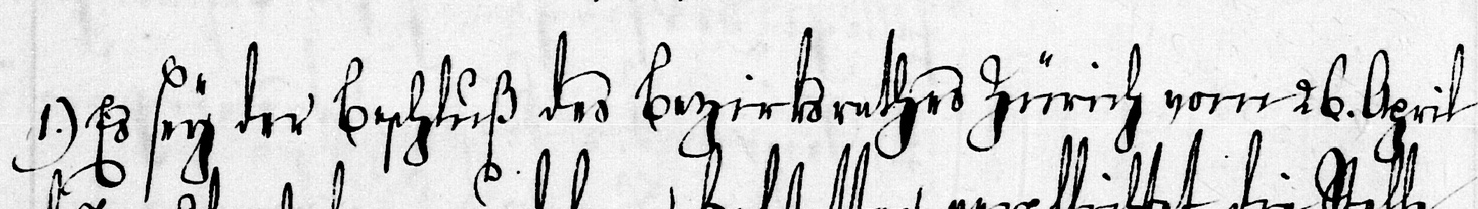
1.) Es sey der Beschluß des Bezirksrathes Zürich vom 26. April
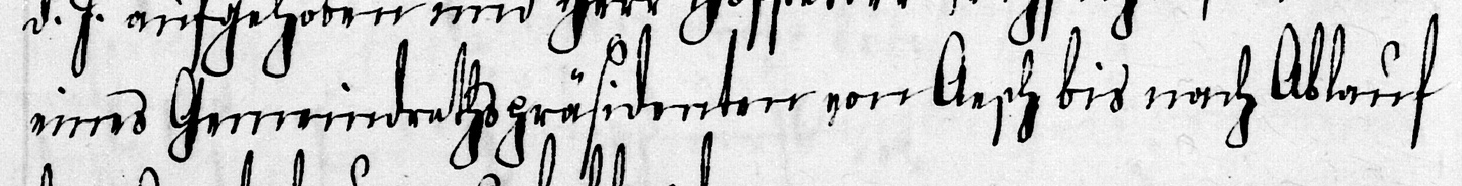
eines Gemeindrathspräsidenten von Aesch bis nach Ablauf
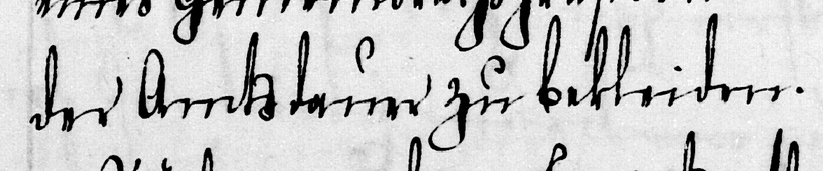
der Amtsdauer zu bekleiden.
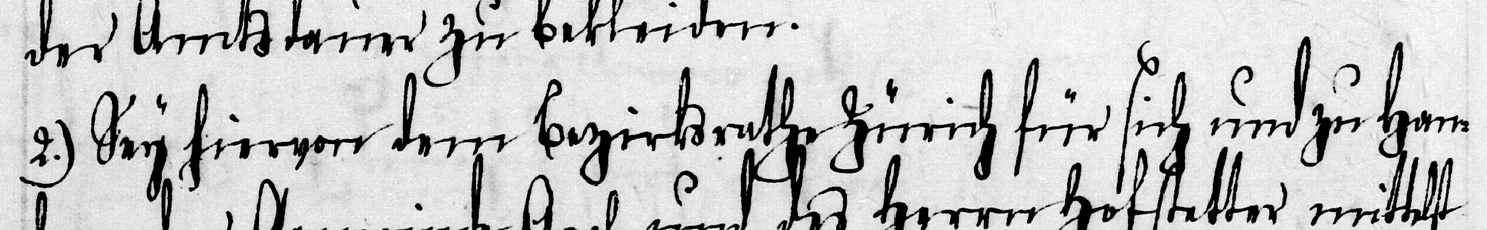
2.) Sey hiervon dem Bezirksrathe Zürich für sich und zu Han¬
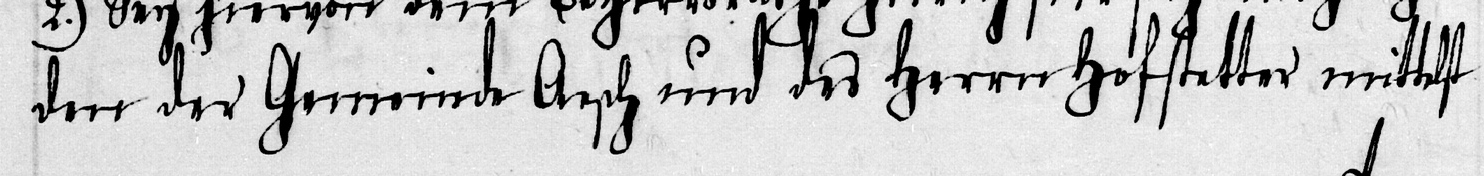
den der Gemeinde Aesch und des Herrn Hofstetter mittelst
